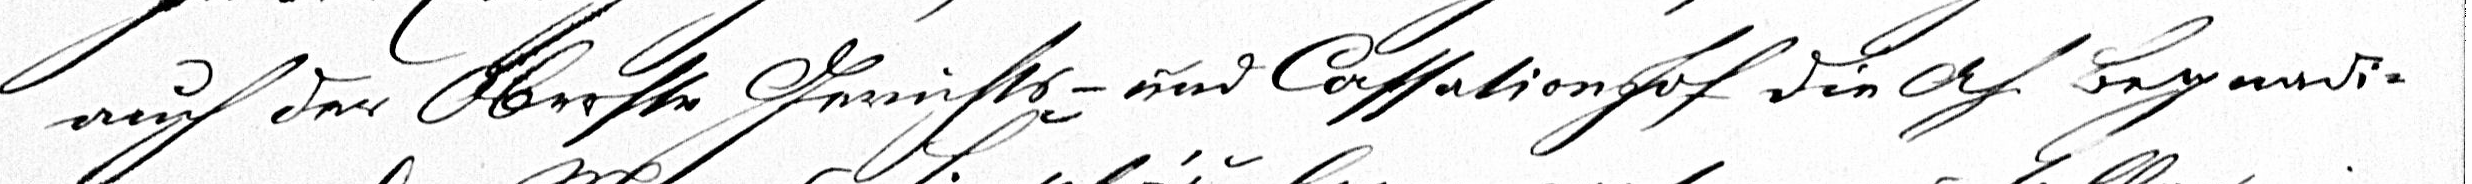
auch der Oberste Gerichts- und Cassationshof die Ah Begnadi¬
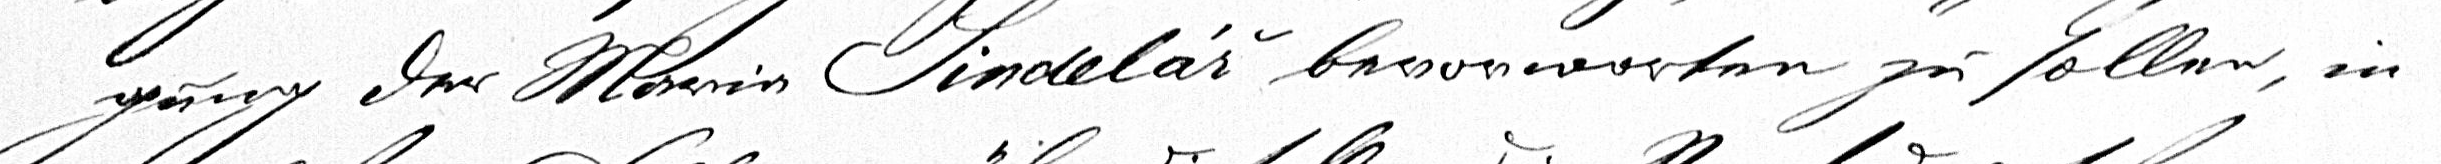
gung der Maria Šindelař bevorworten zu sollen, in
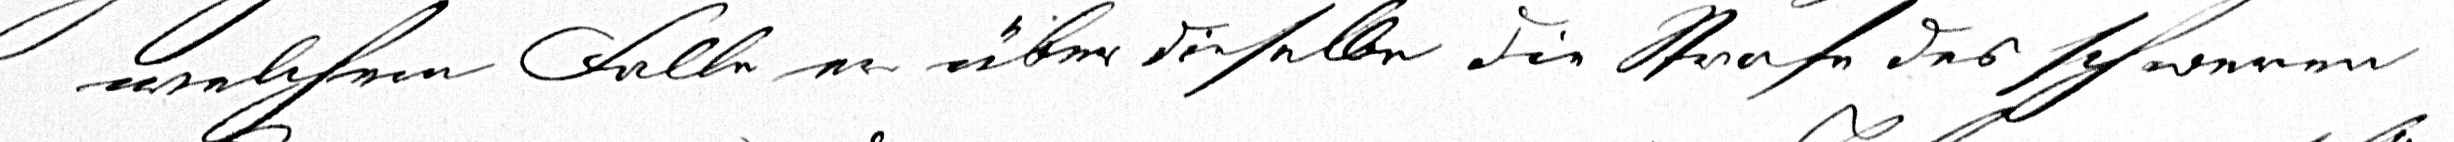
welchem Falle er über dieselbe die Strafe des schweren
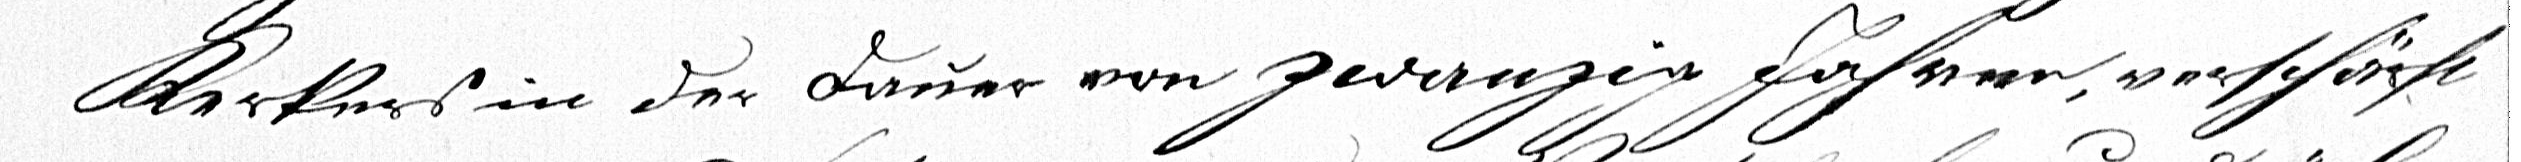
Kerkers in der Dauer von zwanzig Jahren, verschärft
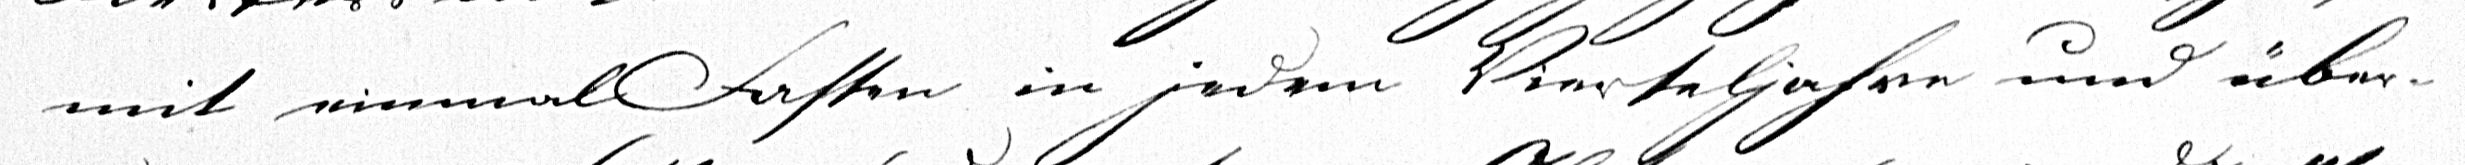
mit einmal Fasten in jedem Vierteljahre und über¬
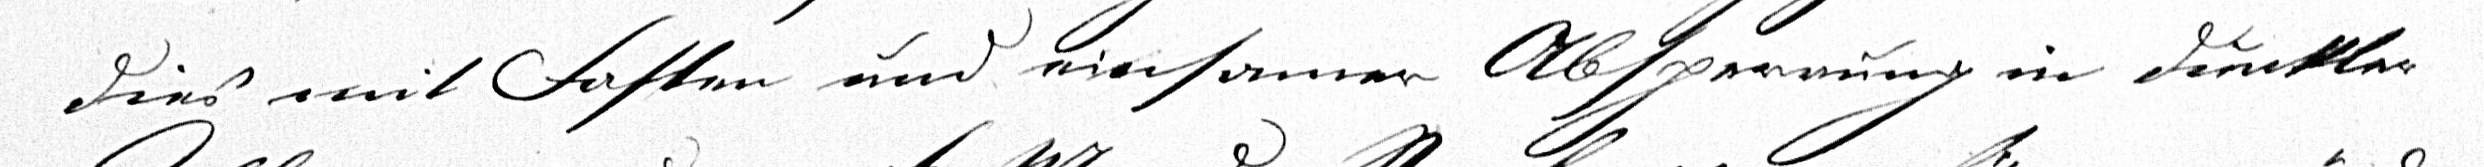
dies mit Fasten und einsamer Absperrung in Dunkler
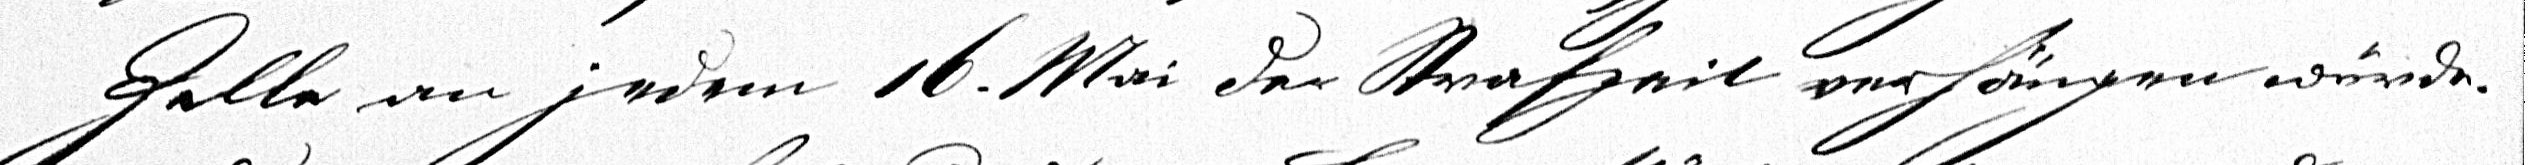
Zelle an jedem 16. Mai der Strafzeit verhängen würde.
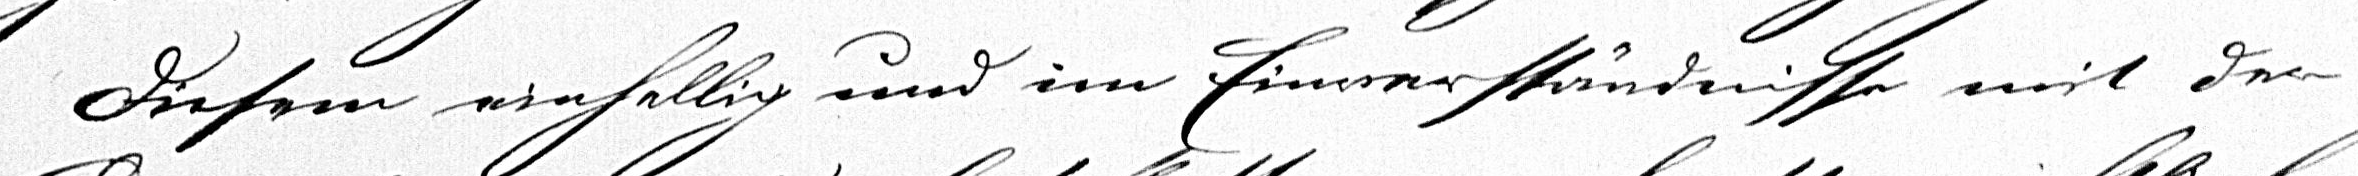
Diesem einhellig und im Einverständnisse mit der
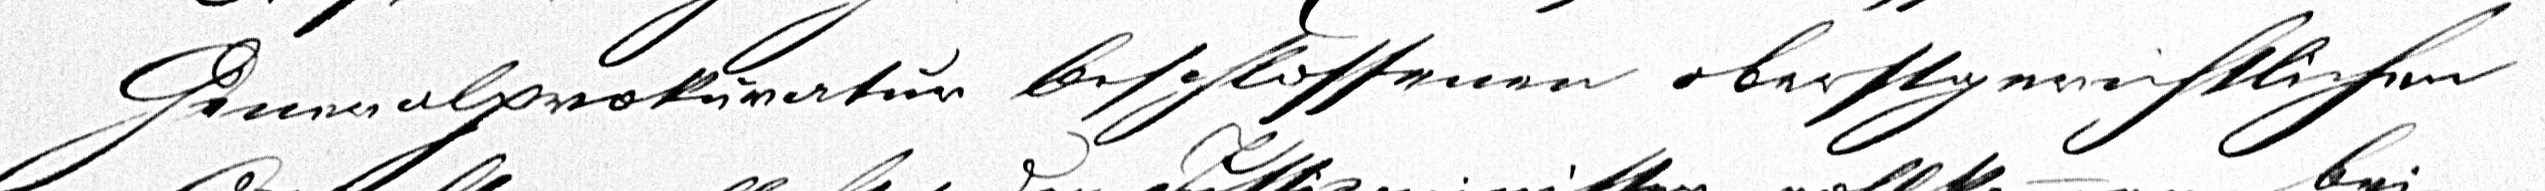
Generalprokuratur beschlossenen oberstgerichtlichen
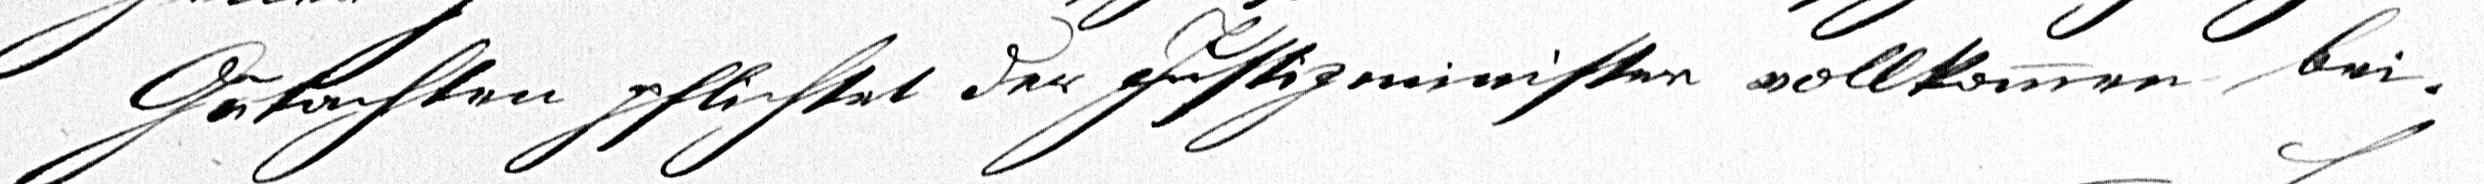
Gutachten pflichtet der Justizminister vollkommen bei.
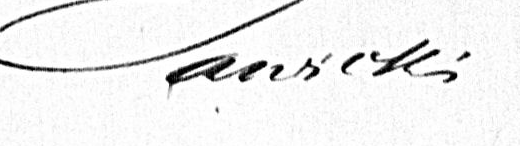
Sawicki
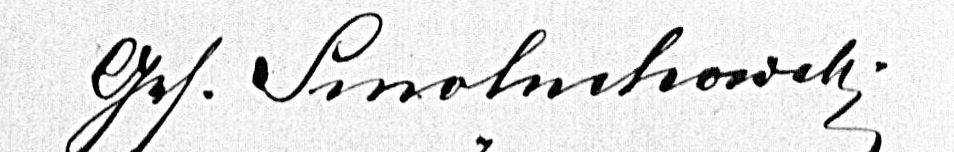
Ges. Smolmxx
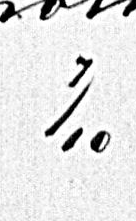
7/10
